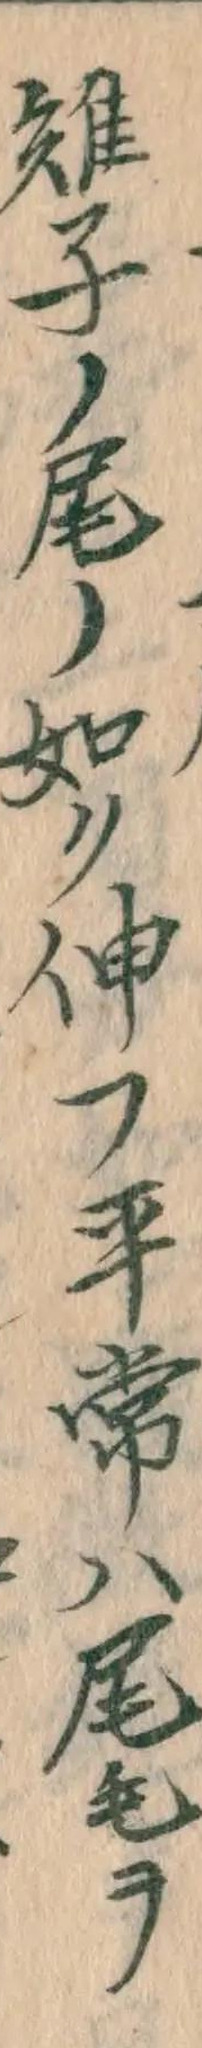雉子ノ尾ノ如ク伸フ平常ハ尾毛ヲ
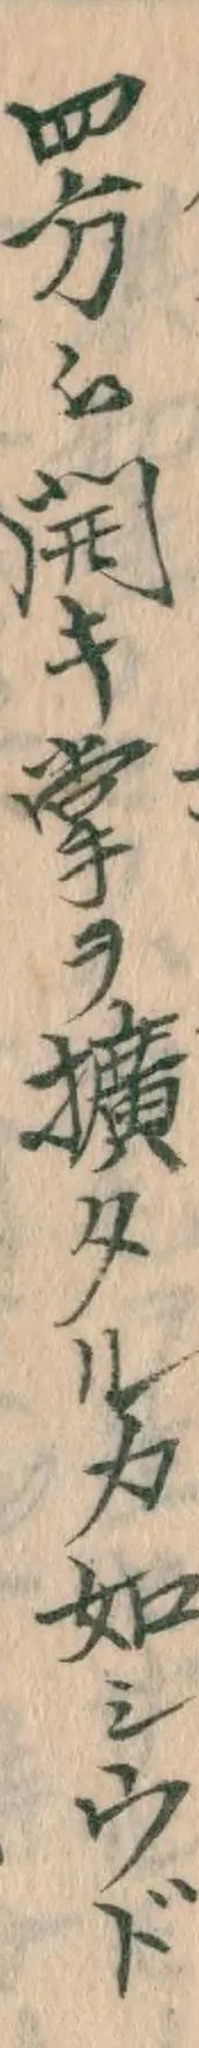四方エ開キ掌ヲ拡タルカ如シウド
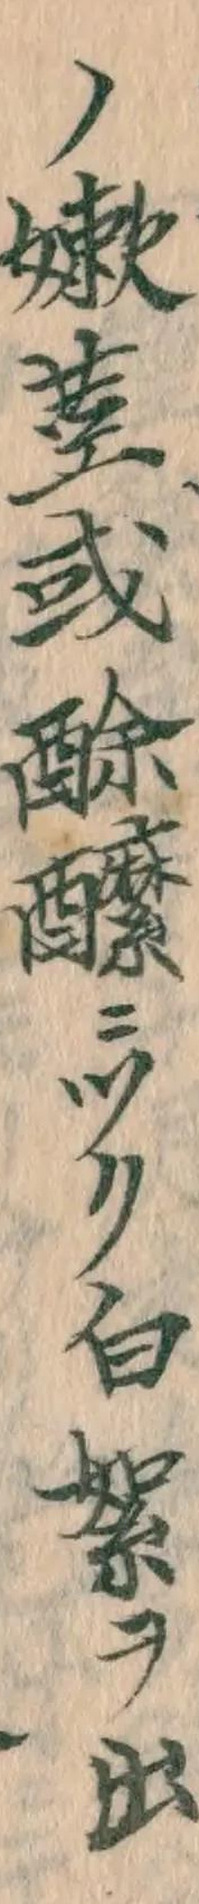ノ嫩茎或酴醿ニツク白絮ヲ出
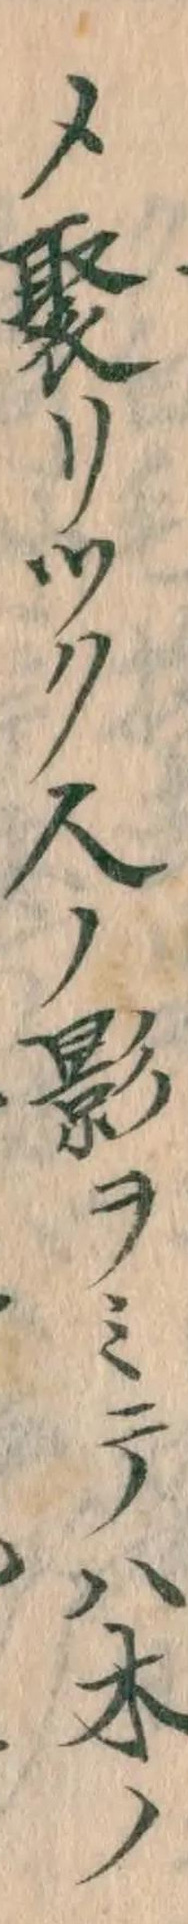シテ聚リツク人ノ影ヲミテハ木ノ
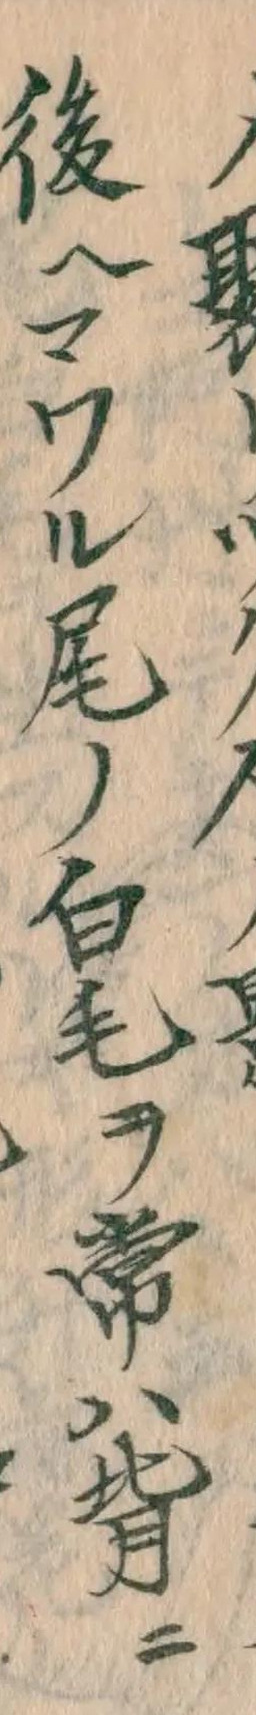後へマワル尾ノ白毛ヲ常ハ背ニ
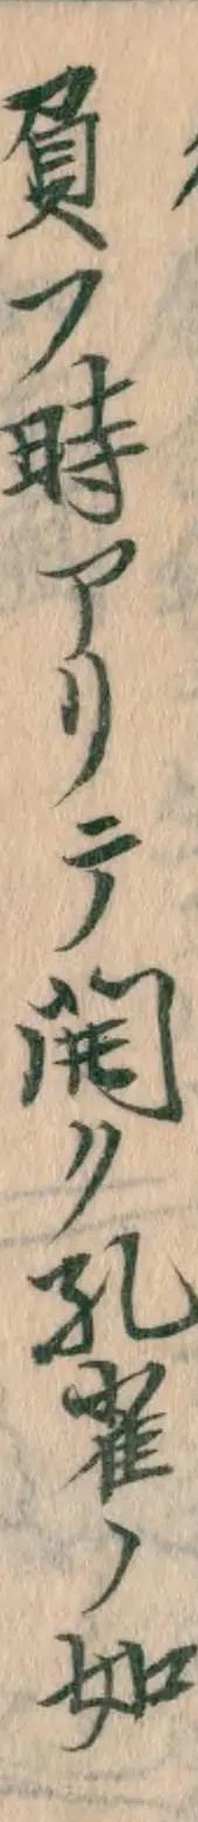負フ時アリテ開ク孔雀ノ如
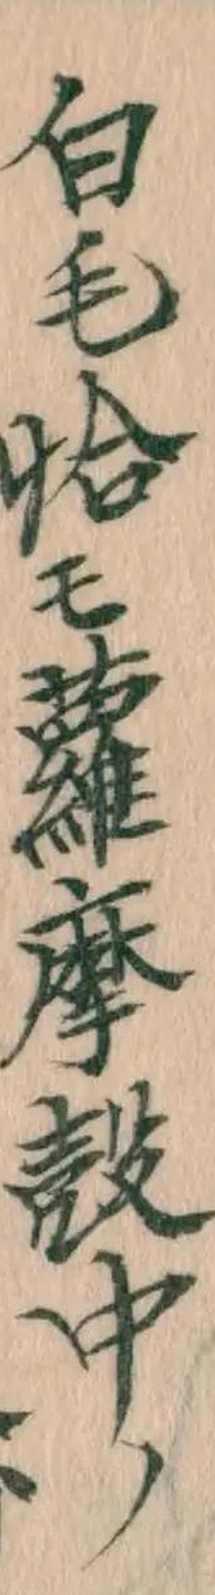白毛恰モ蘿摩殻中ノ
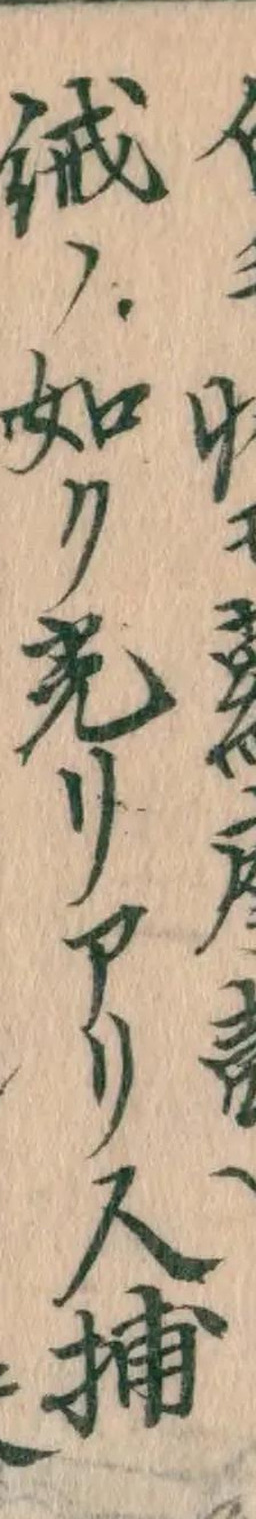絨ノ如ク光リアリ人捕
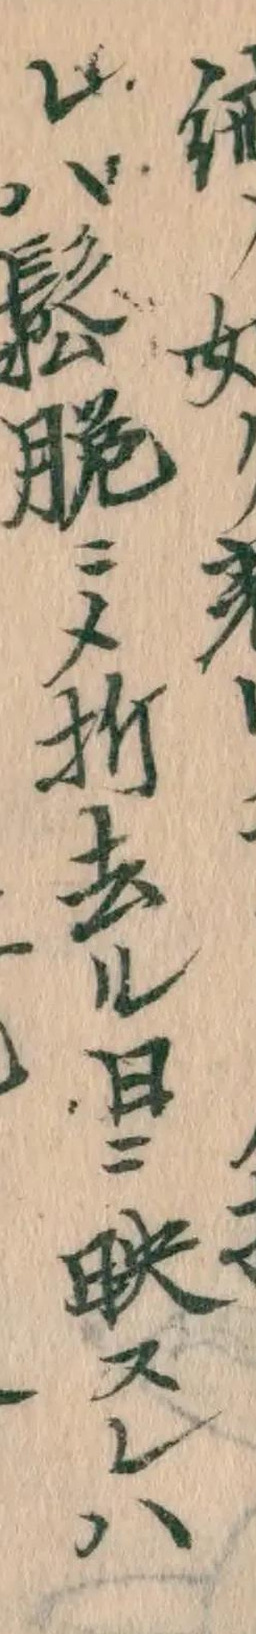レバ鬆脆ニシテ折去ル日ニ映スレハ
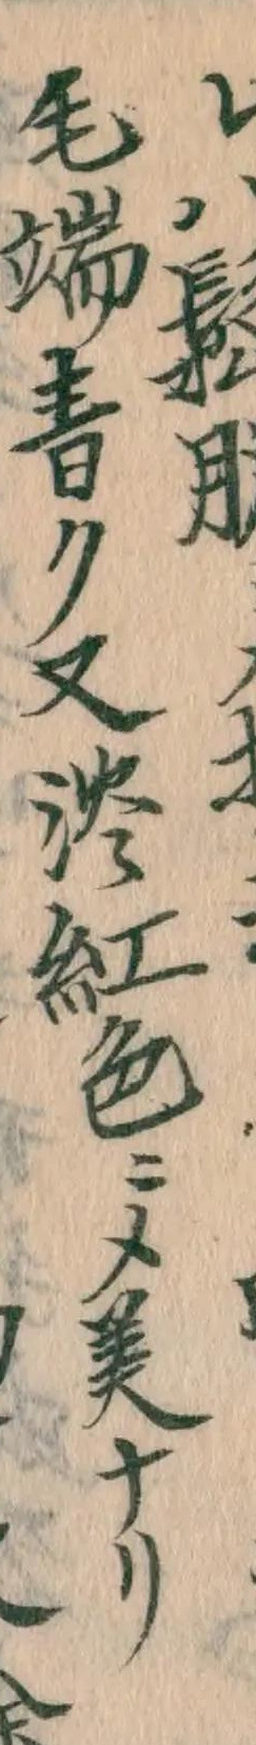毛端青ク又淡紅色ニシテ美ナリ
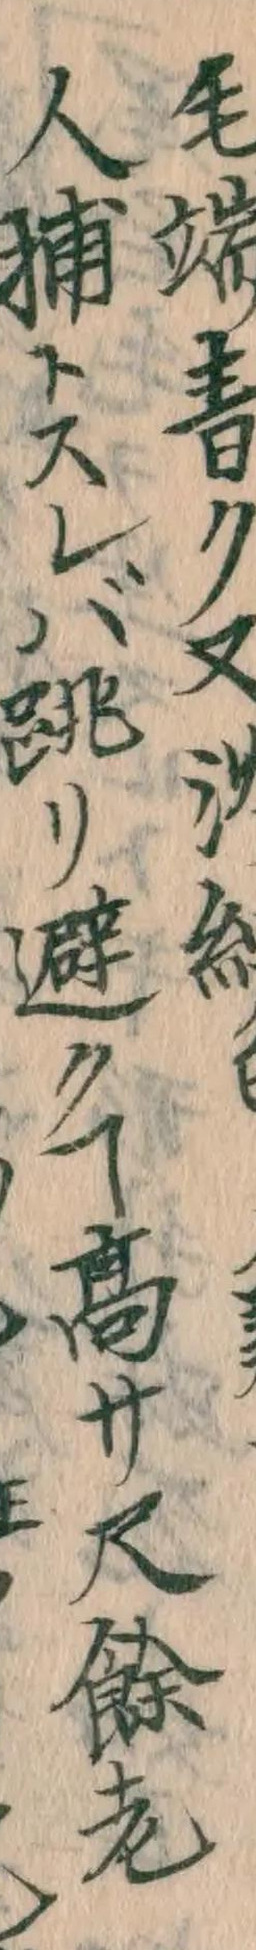人捕トスレバ跳リ避クコト高サ尺餘老
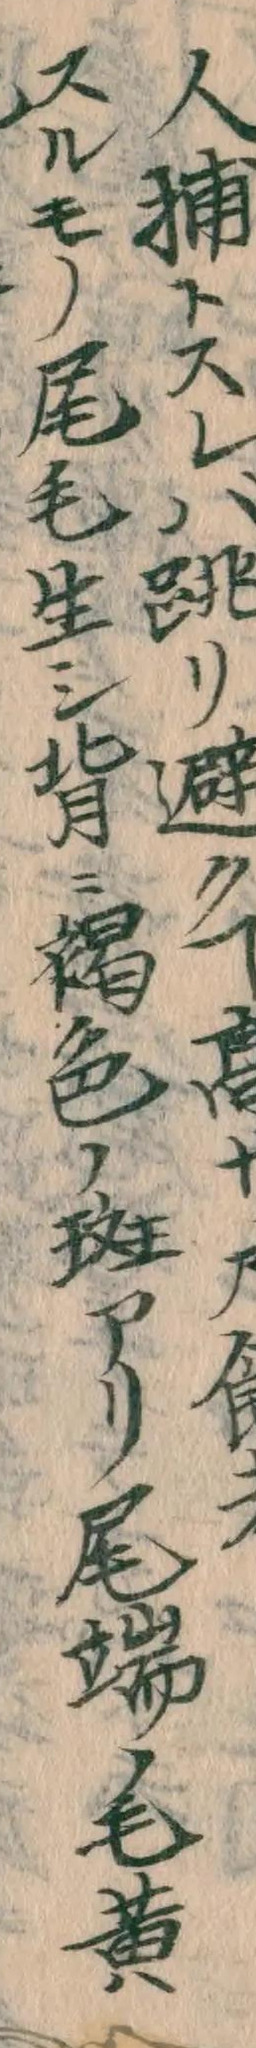スルモノ尾毛生シ背ニ褐色ノ斑アリ尾端ノ毛黄
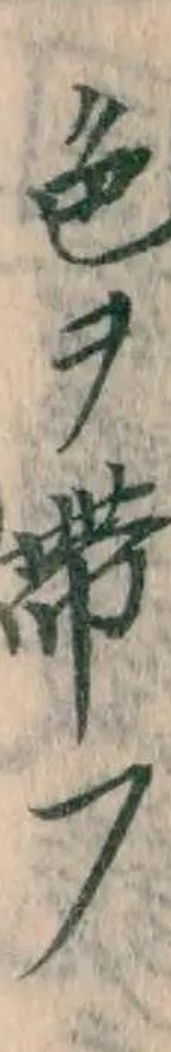色ヲ帯フ
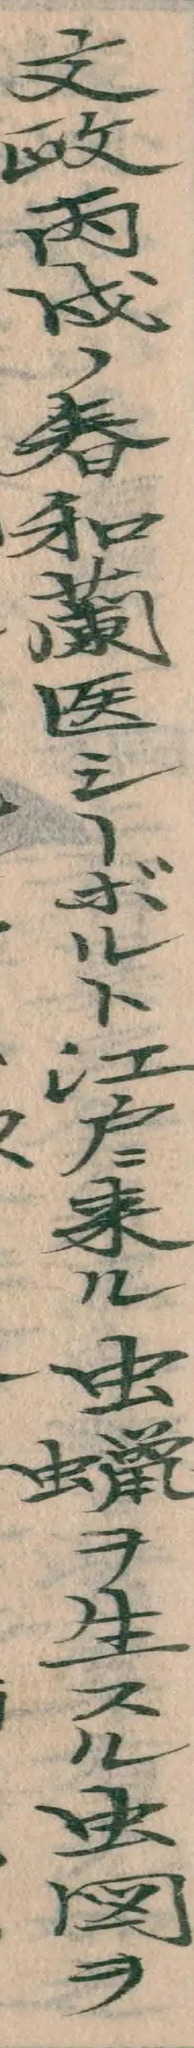文政丙戌春和蘭医シーボルト江戸ニ来ル虫蝋ヲ生スル虫図ヲ
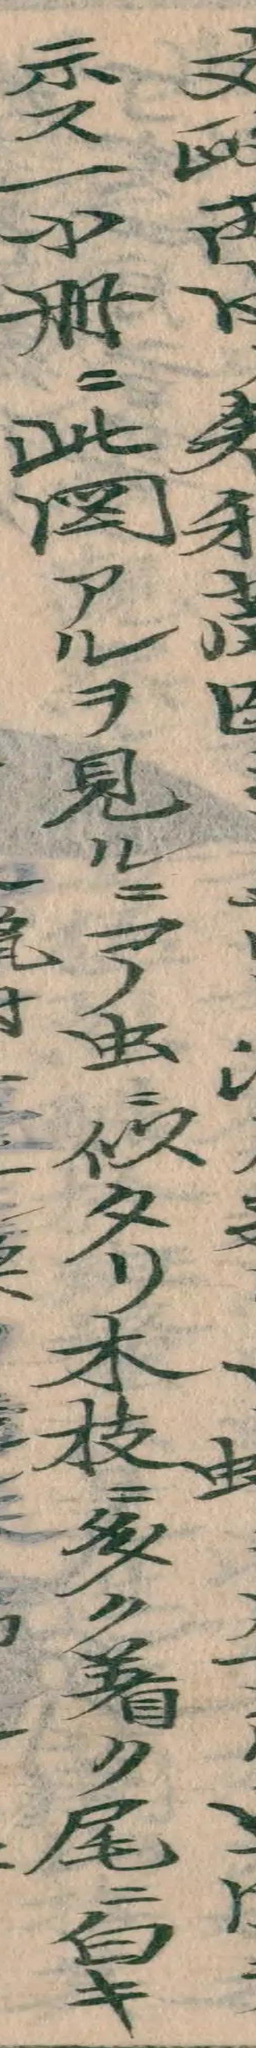示ス一小冊ニ此図アルヲ見ルニコノ虫ニ似タリ木枝ニ多ク着ク尾ニ白キ
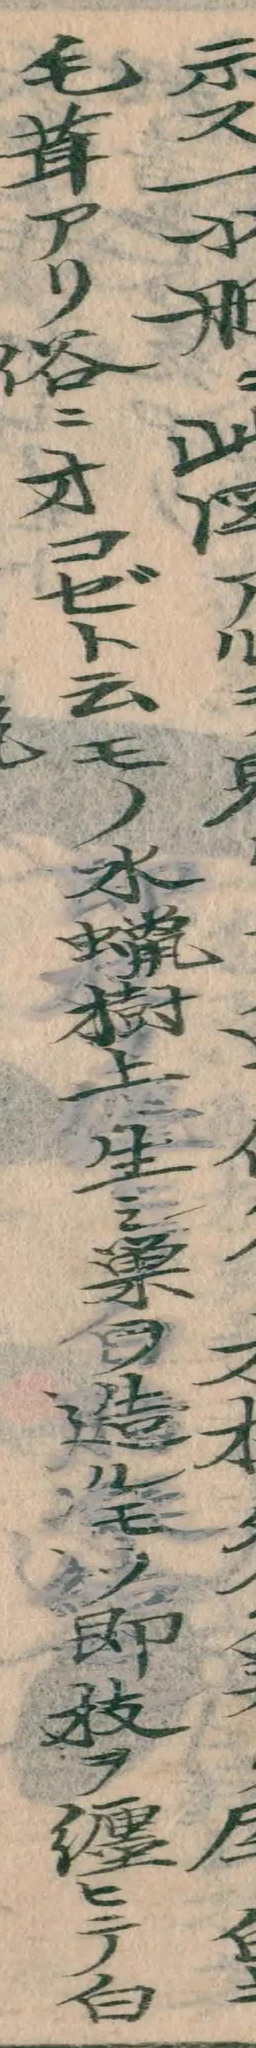毛茸アリ俗ニオコゼト云モノ水蝋樹上ニ生シ巣ヲ造ルモノ即枝ヲ纏ヒテ白
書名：千蟲譜 3巻. [3]
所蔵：国立国会図書館 National Diet Library, JAPAN
